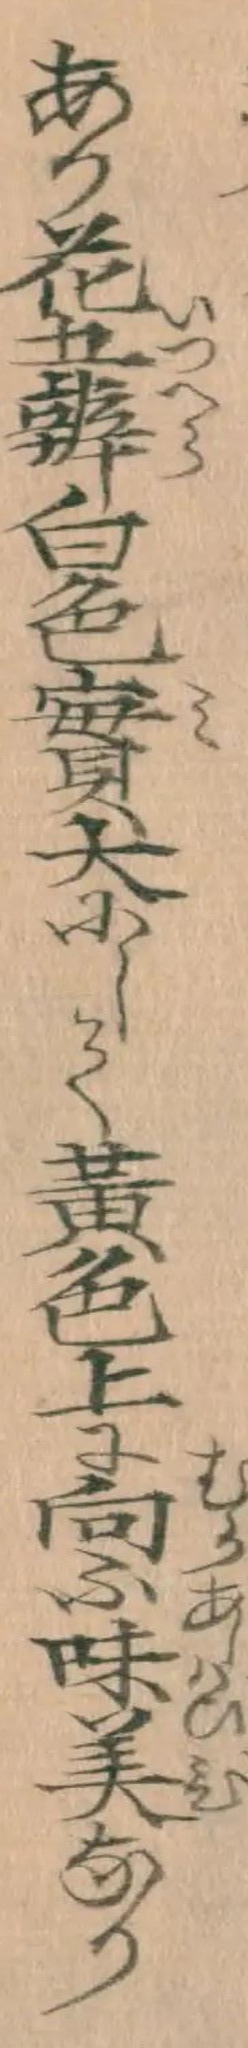あり花五弁白色実大にして黄色上に向ふ味美なり
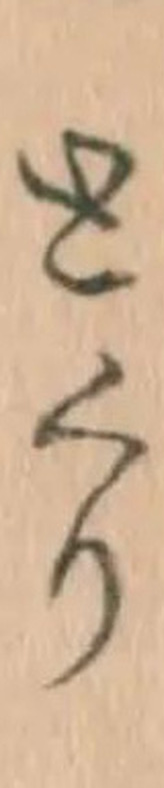とくり
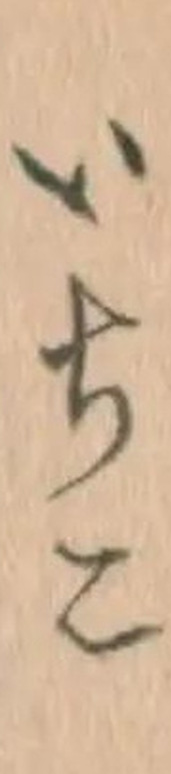いちこ

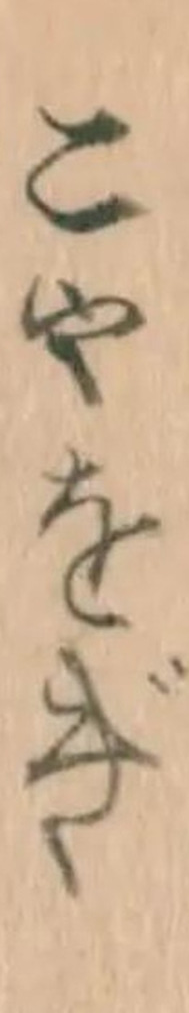こやをぎ
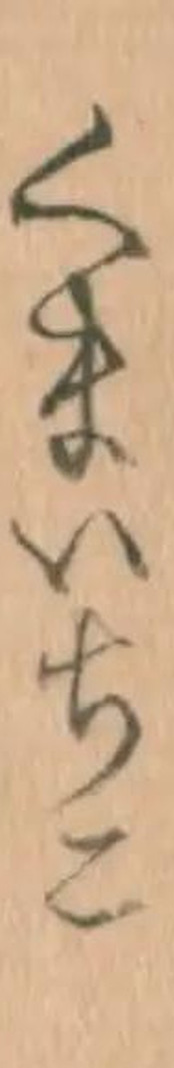くまいちこ

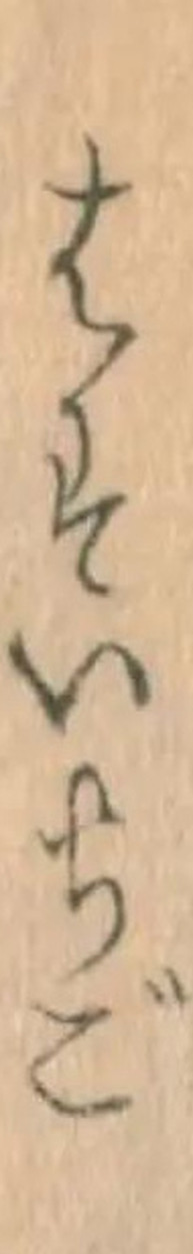はすいちご
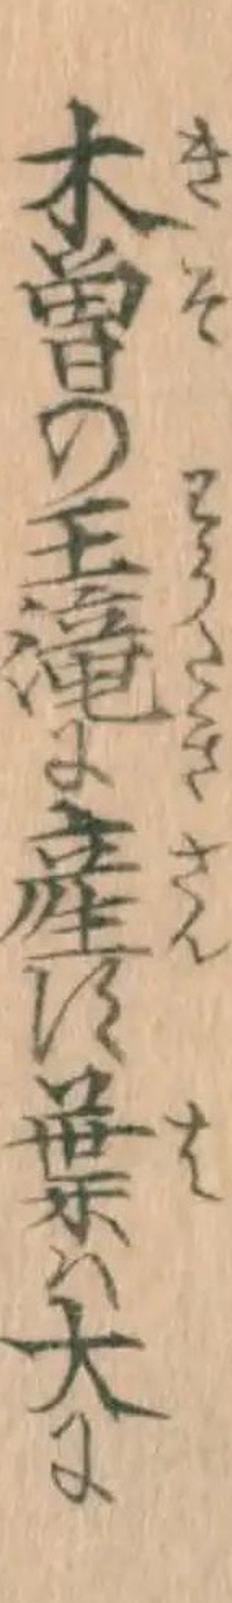木曽の王滝に産す葉は大に
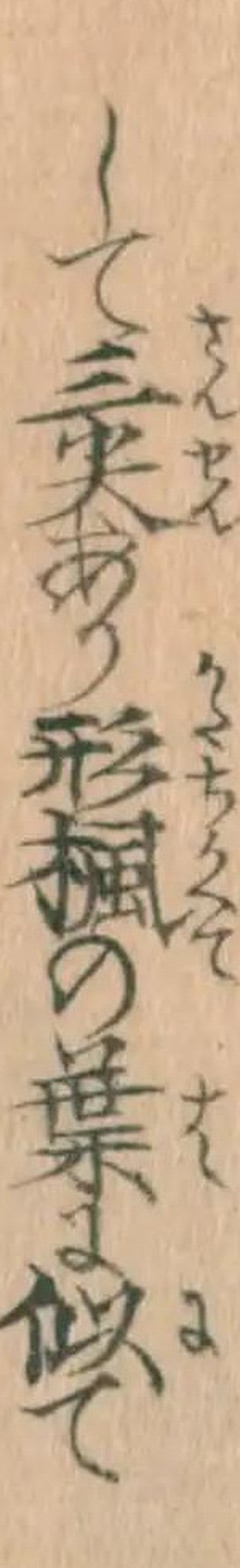して三尖あり形楓の葉に似て
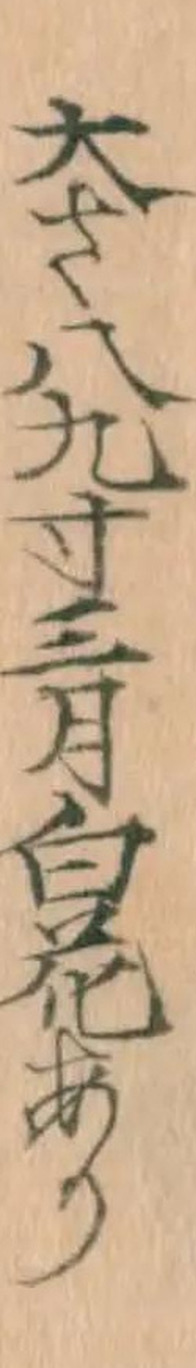大さ八九寸三月白花あり
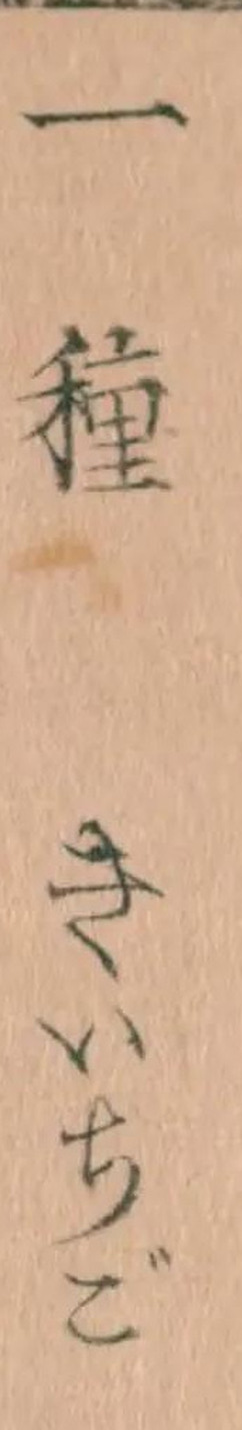一種きいちご
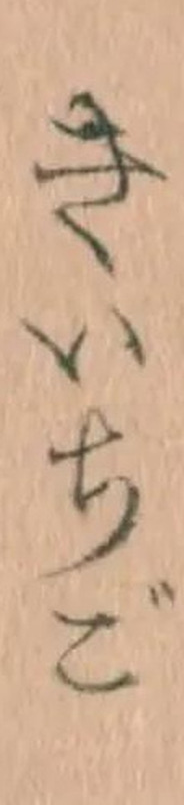きいちご
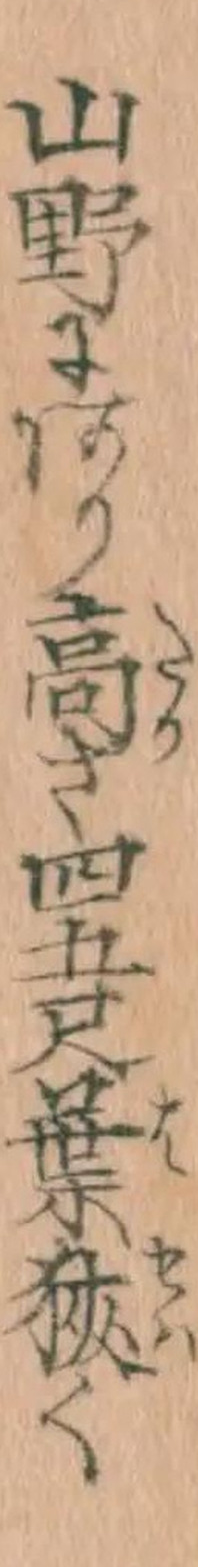山野にあり高さ四五尺葉狭く
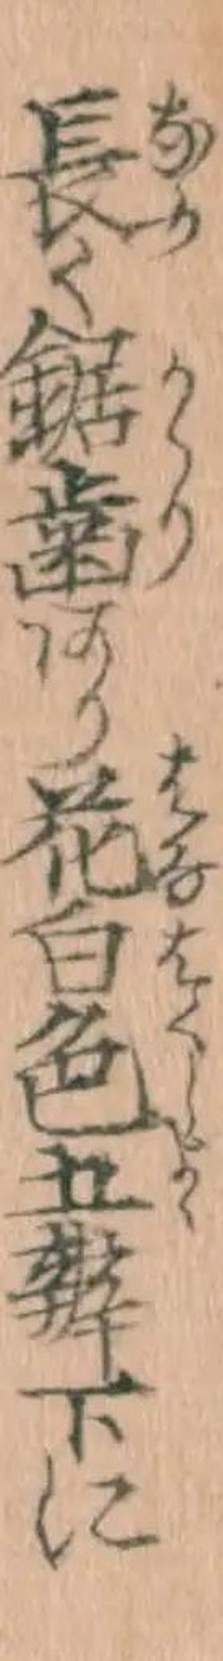長く鋸歯あり花白色五弁下に
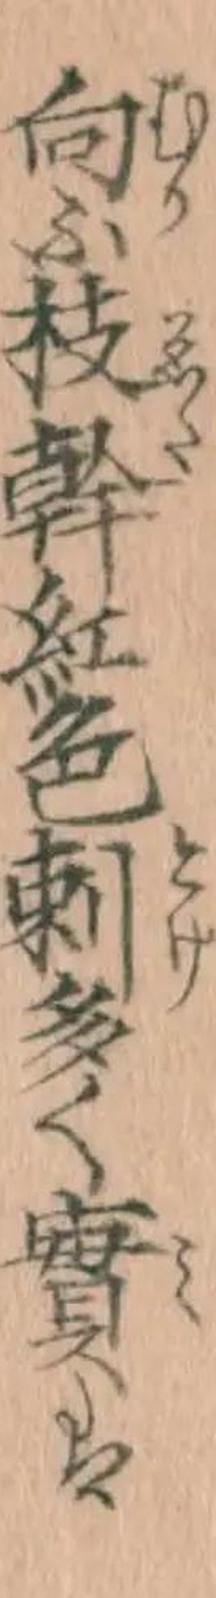向ふ枝幹紅色剌多く実は
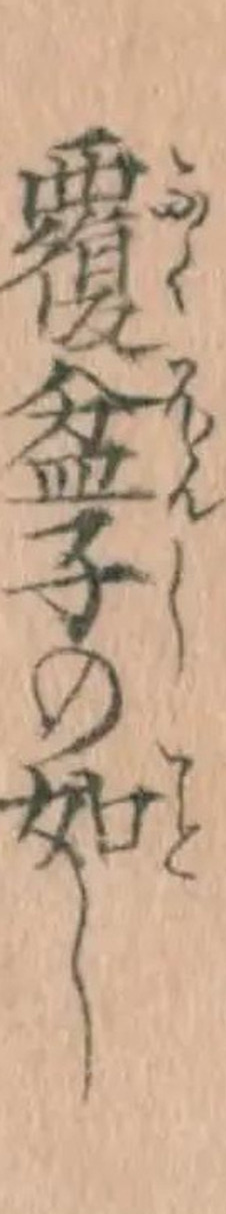覆盆子の如し
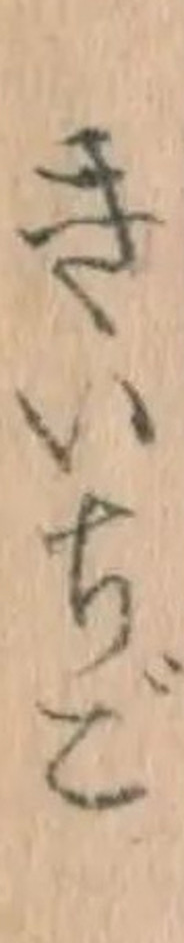きいちご
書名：本草図譜. 巻25-27
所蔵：国立国会図書館 National Diet Library, JAPAN
